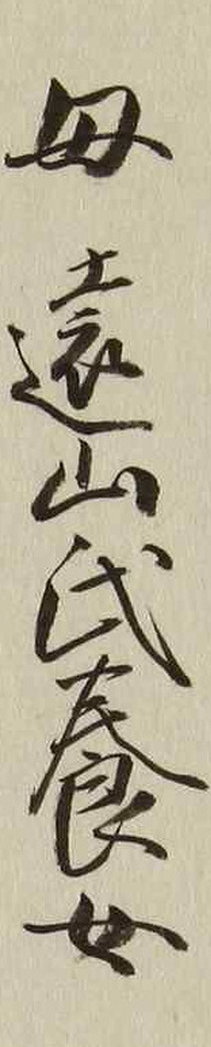母遠山氏養女
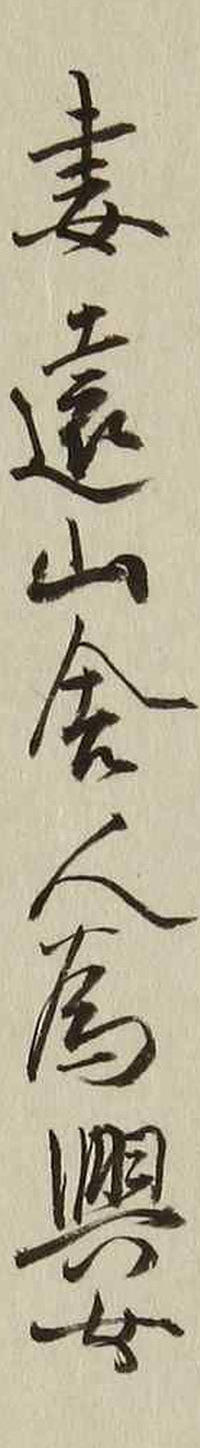妻遠山舎人為興女
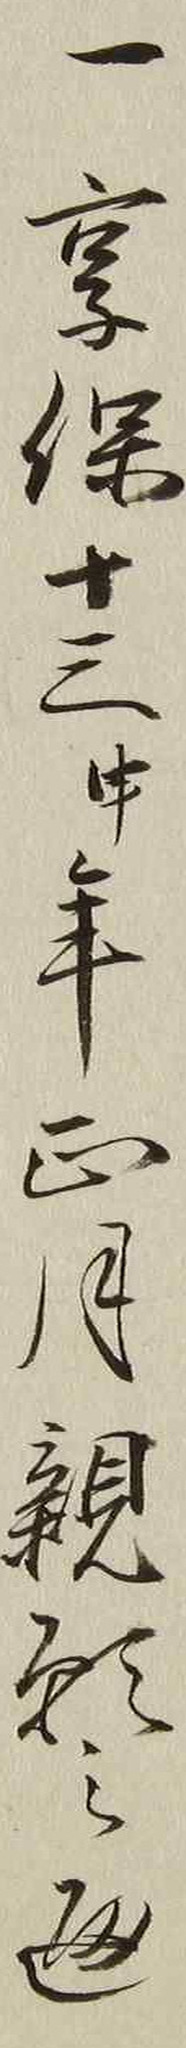一享保十三申年正月親願之通
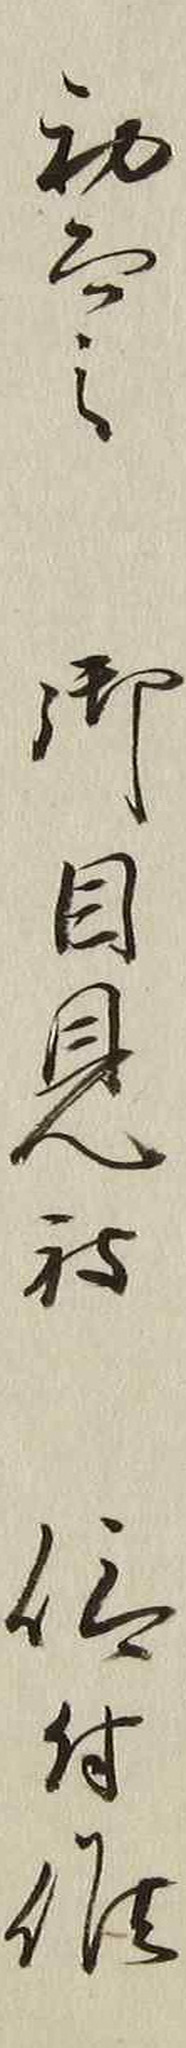初而之御目見被仰付候
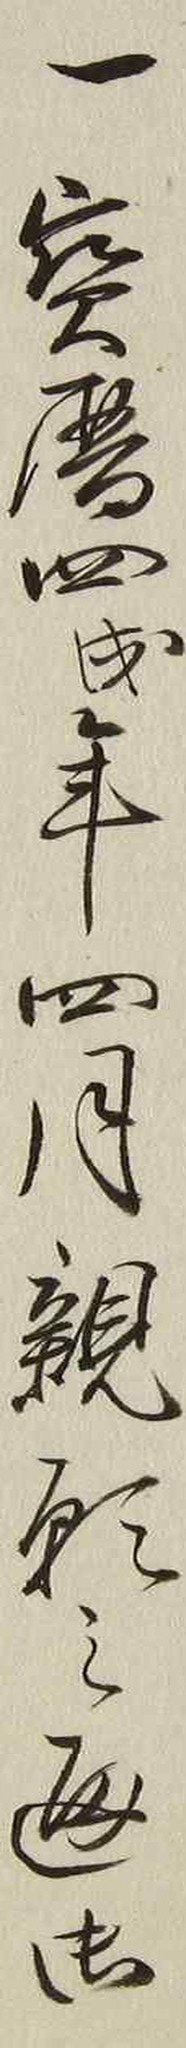一宝暦四戌年四月親願之通御
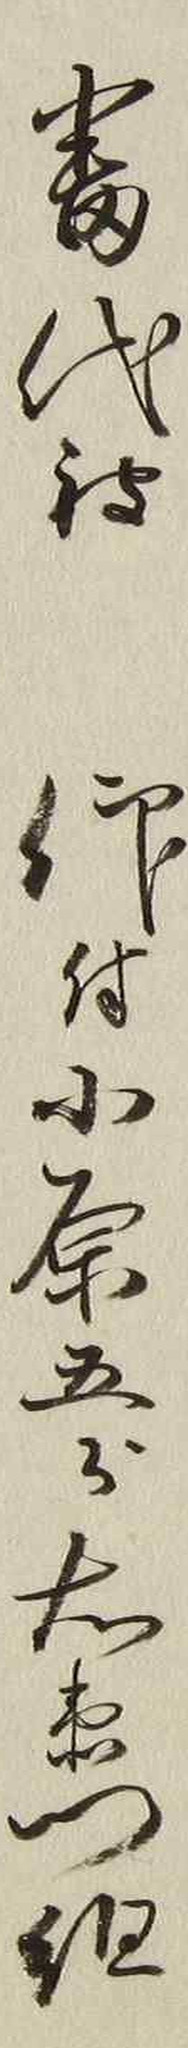番代被仰付小原五郎右衛門組
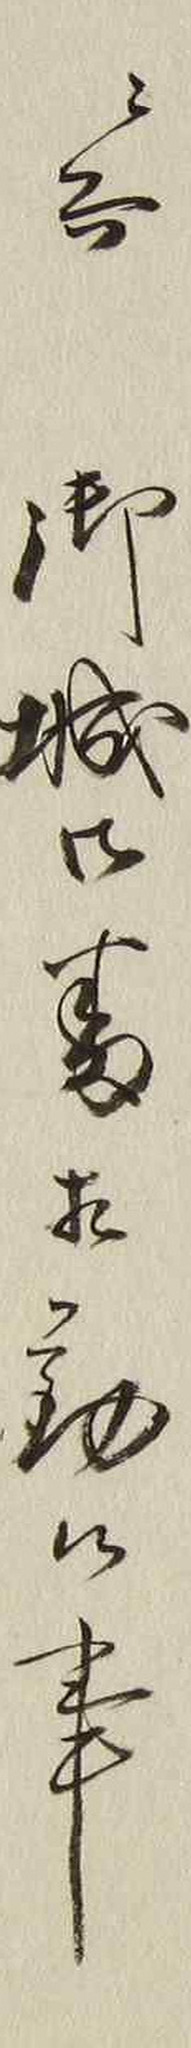ニ而御城御番相勤候事
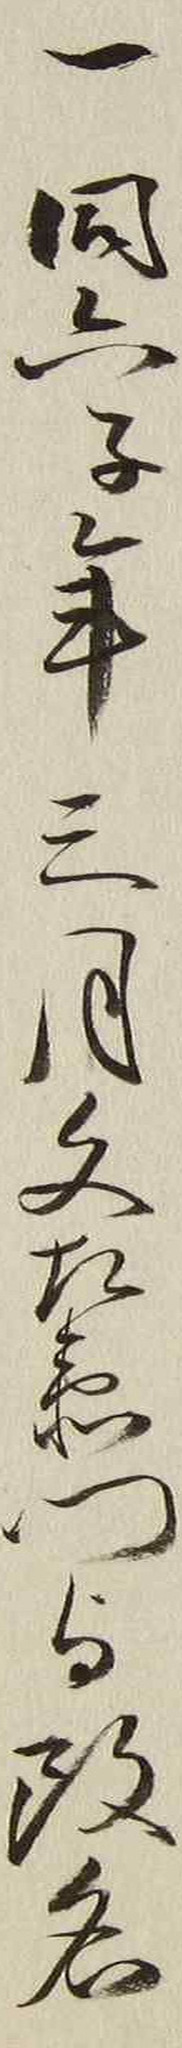一同六子年三月文左衛門と改名
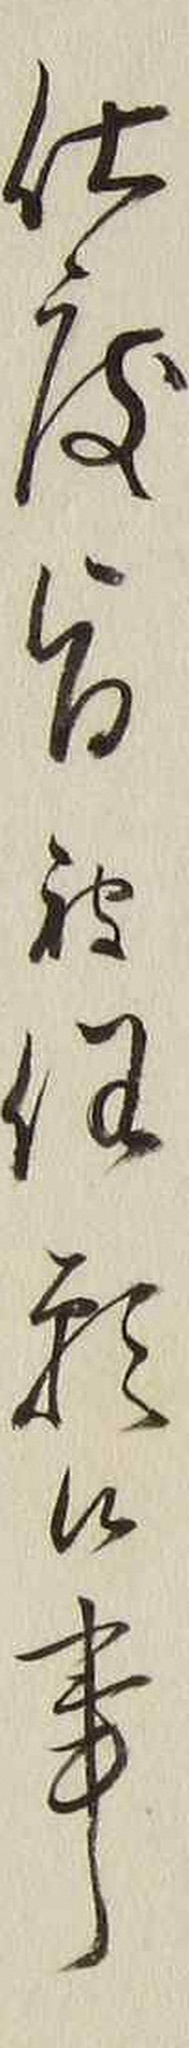仕度旨被任願候事
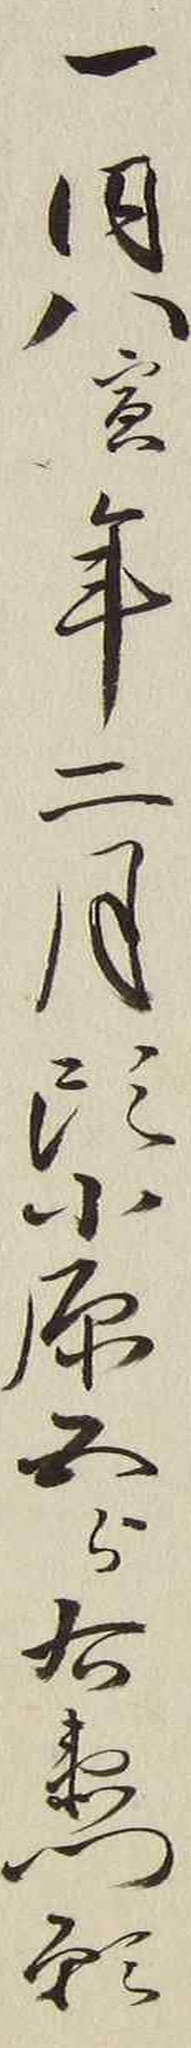一同八寅年二月頭小原五郎右衛門願
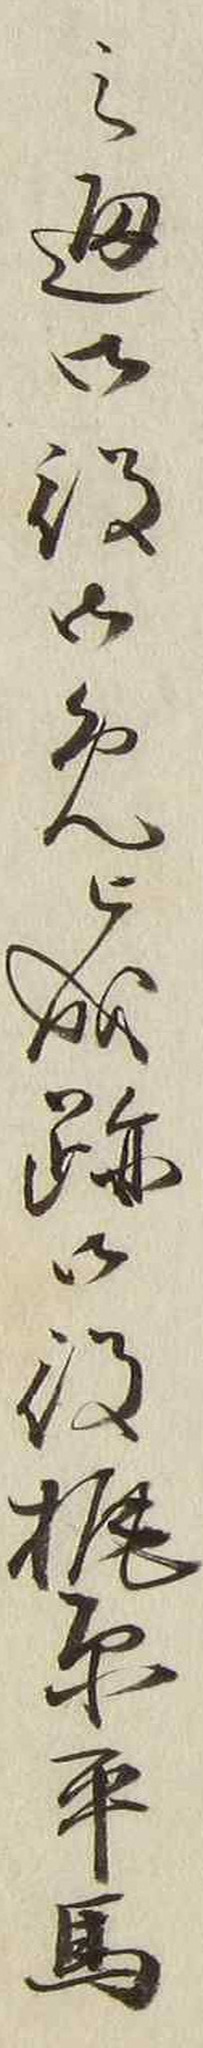之通御役御免被成跡御役梶原平馬

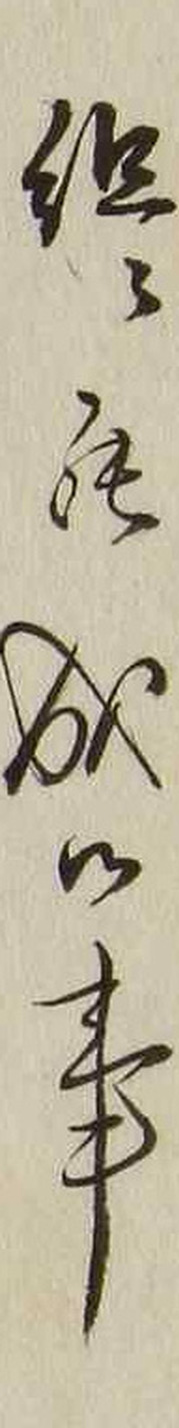組ニ罷成候事
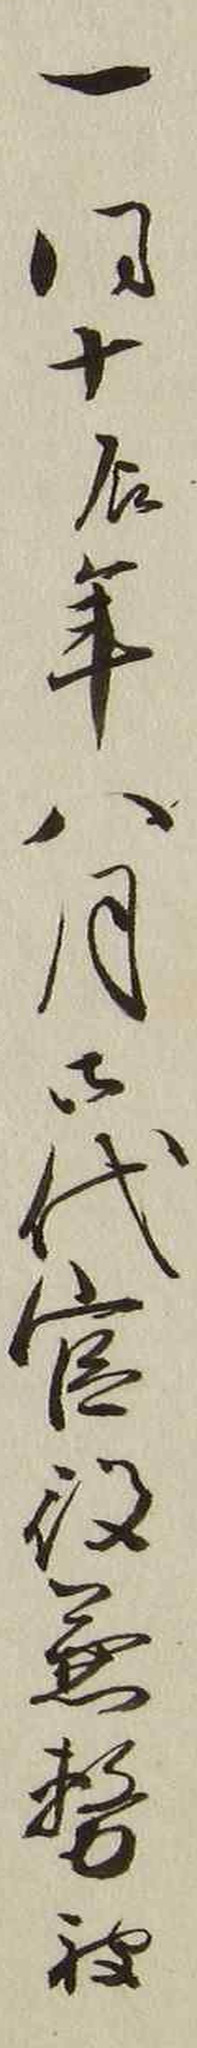一同十辰年八月御代官役兼務被
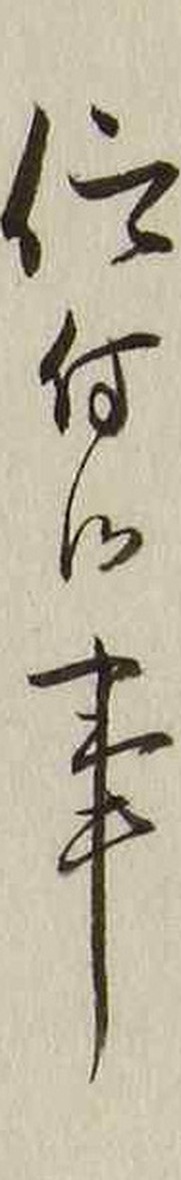仰付候事
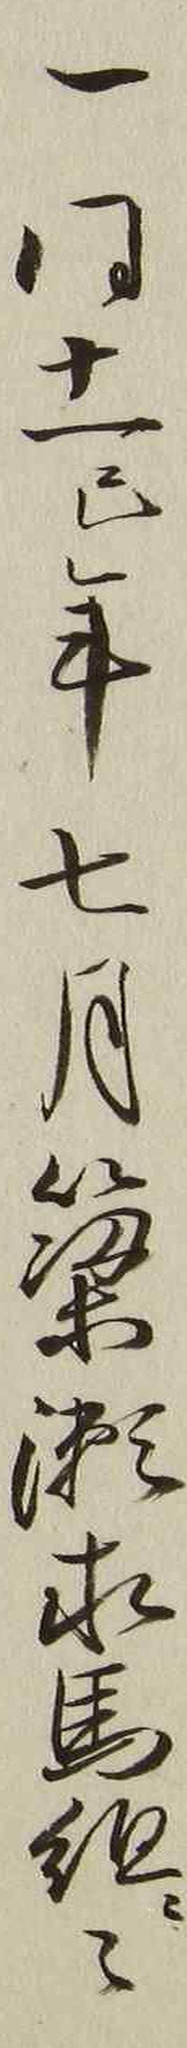一同十一巳年七月簗瀬求馬組ニ々
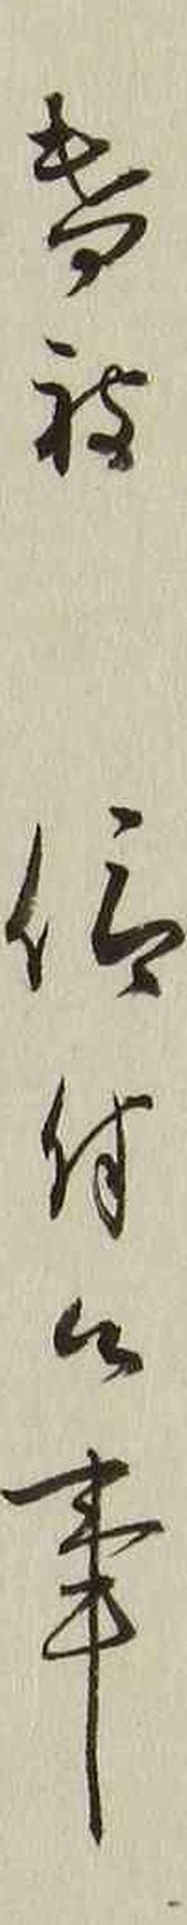替被仰付候事
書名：諸士系譜　巻之163　な之部5
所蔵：会津若松市立会津図書館
